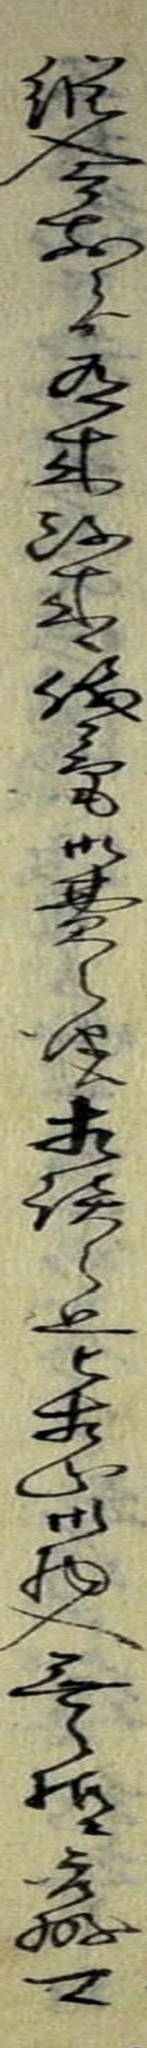縦令前々ゟ有来致来候儀ニ而も御費之儀ハ相談之上被相止御物入無之様ニ取扱可
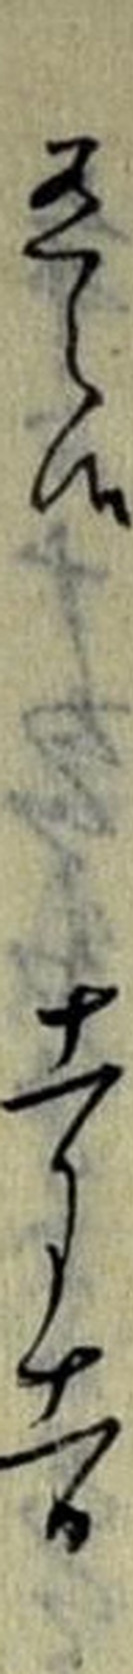有之候十一月十一日
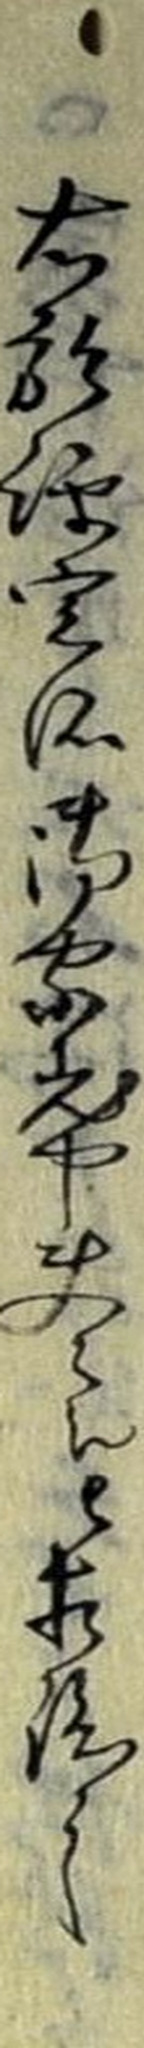右於評定所御家老中夫々江被相渡之
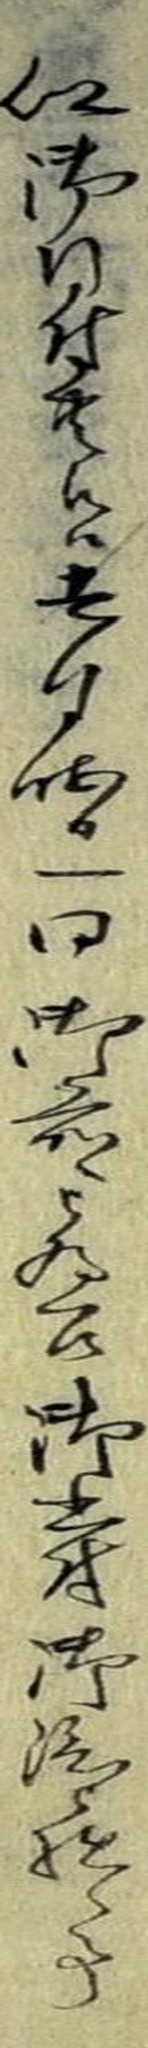但御目付共江ハ去月晦日一同御前へ被為召御書付御渡被遊候事
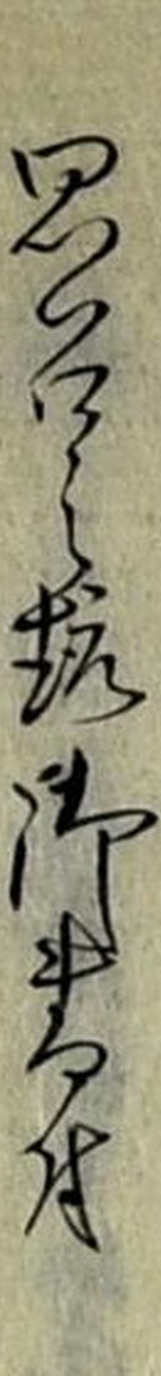思召之趣御書付
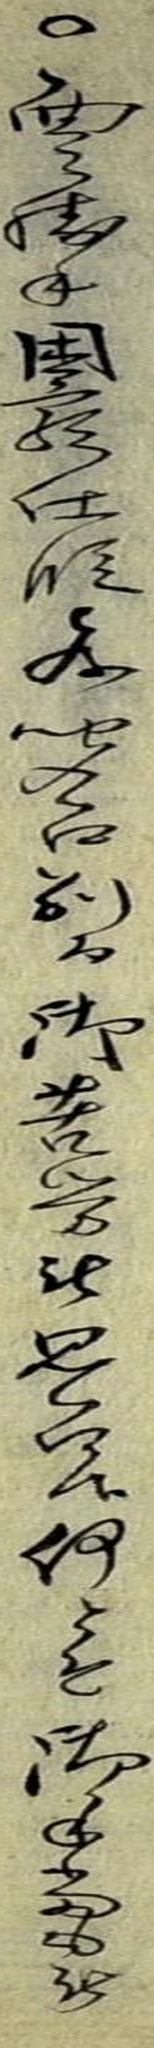〇面々勝手困窮仕段被及聞召別而御苦労被思召候何とそ御手当も被
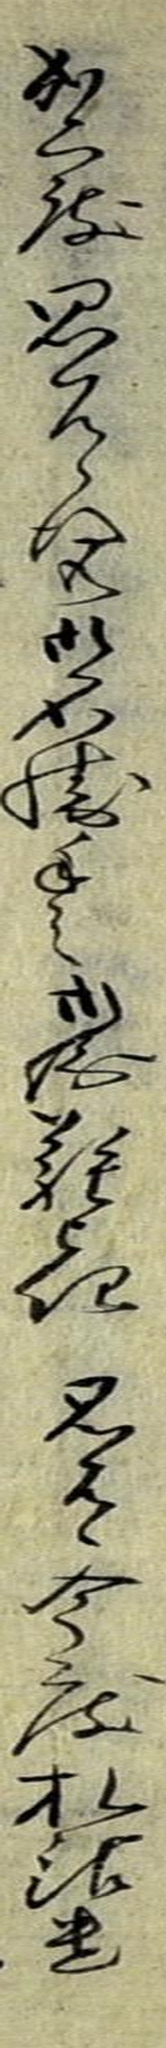成下度思召候得共御不勝手之御儀難被任思召候今度札銀遣
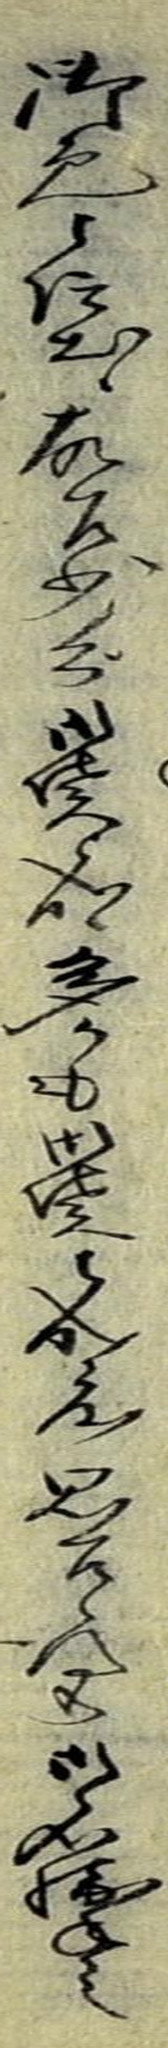御免被仰出候故乍少分御貸被成候多クも御貸被成度思召候得共御不勝手之
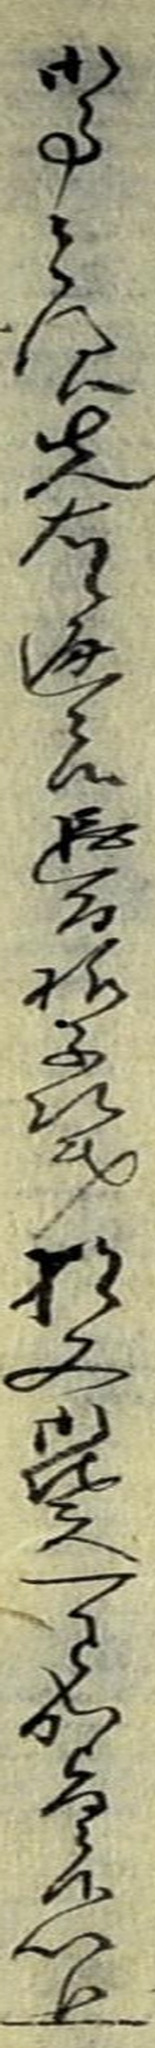御事ニ候得ハ先右之通ニ候追而様子次第猶又御貸可被成旨ニ候以上
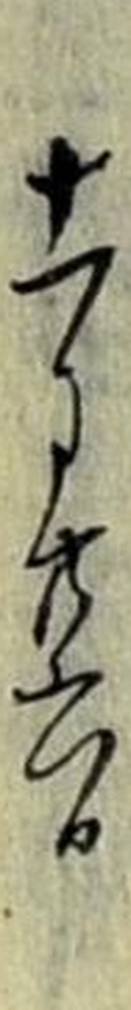十一月廿六日
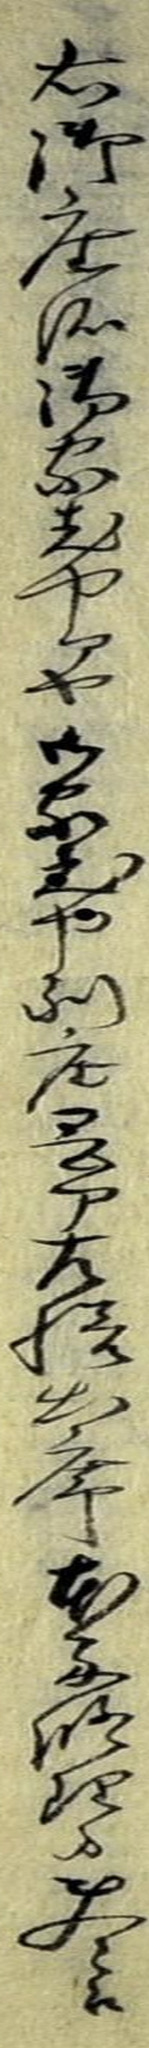右御座所御家老中部屋御家老中列座岡部左膳出席本多修理方夫々江
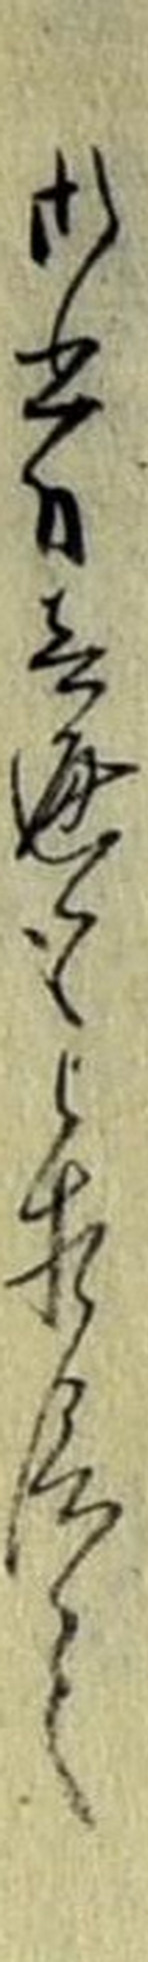御書付壱通ツヽ被相渡之

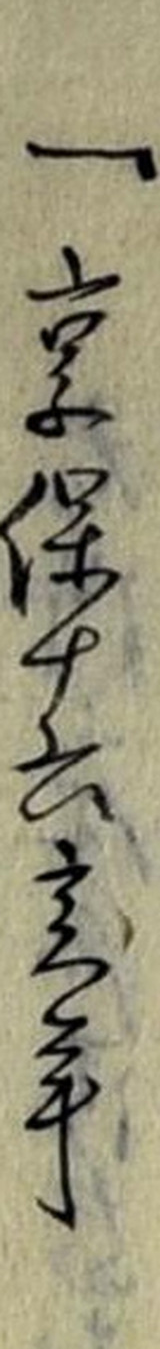一享保十六亥年
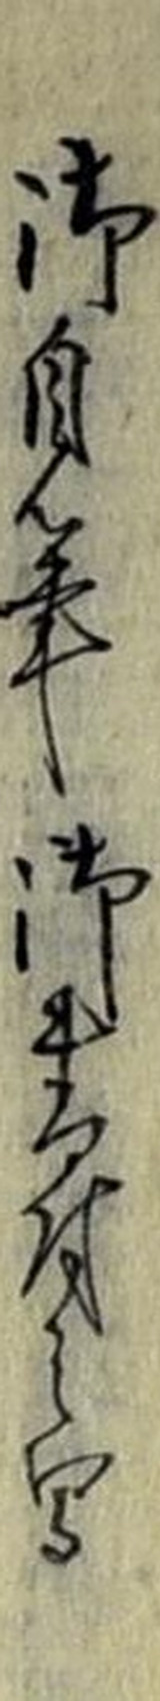御自筆御書付之写
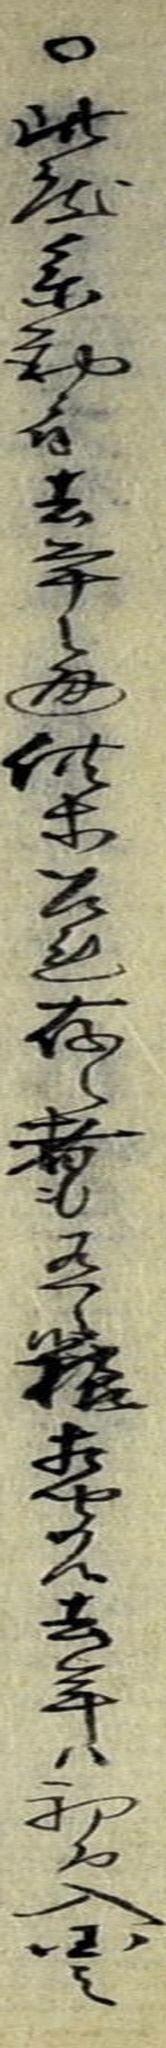〇此度参勤ニ付去年之通供等召連存之者も有之候様相聞候去年ハ初而入国之
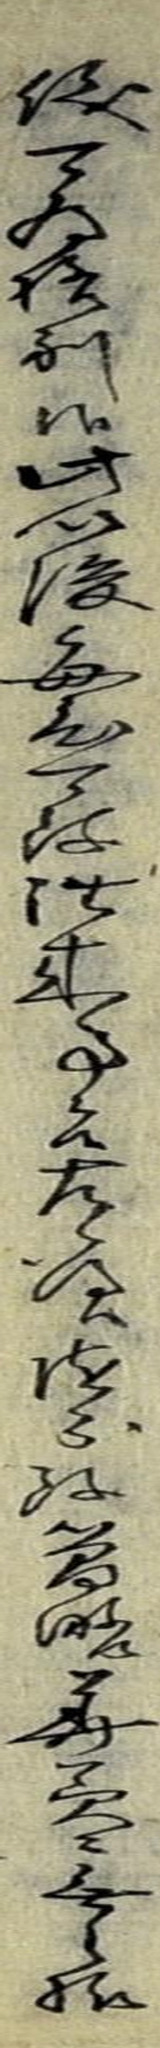儀可為格別候此以後毎度可致往来事ニ候左候得ハ随分致簡略華美ニ無之様
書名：命令之部 一
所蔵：福井県文書館 Fukui Prefectural Archives
